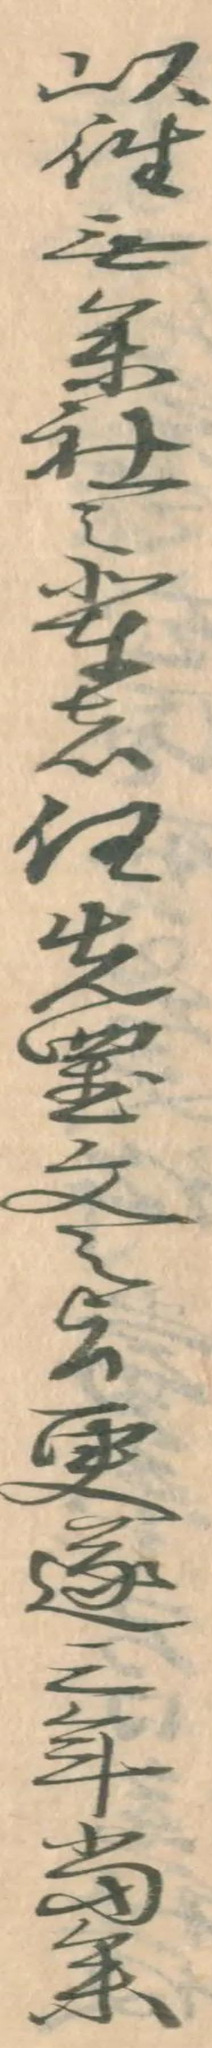以往無参社之輩者任先置文之旨更遂三年當参

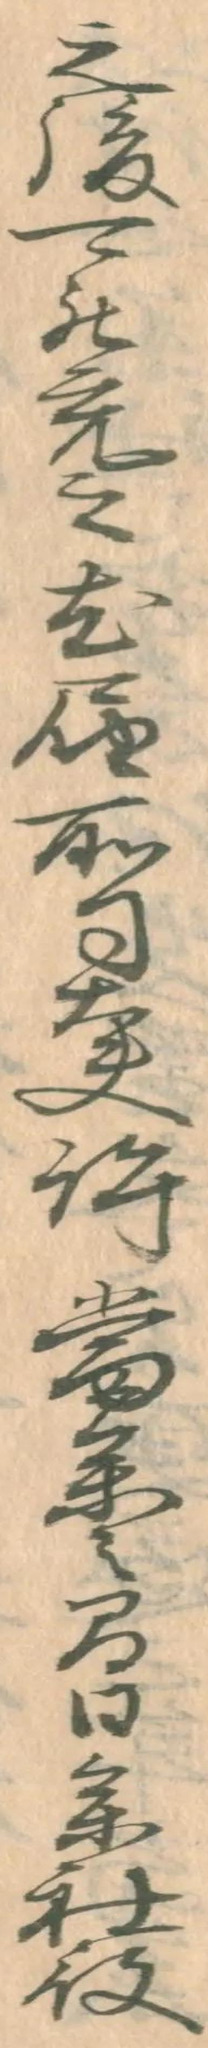之後可被充之尤届所司大夫許當参之間日参社役
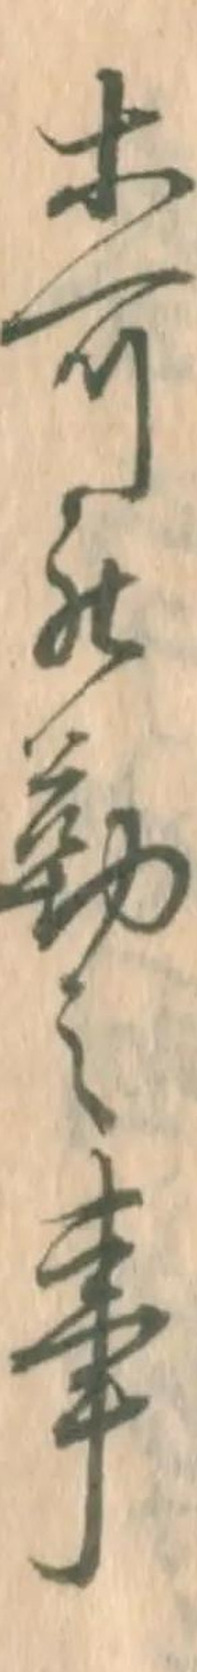等可被勤之事
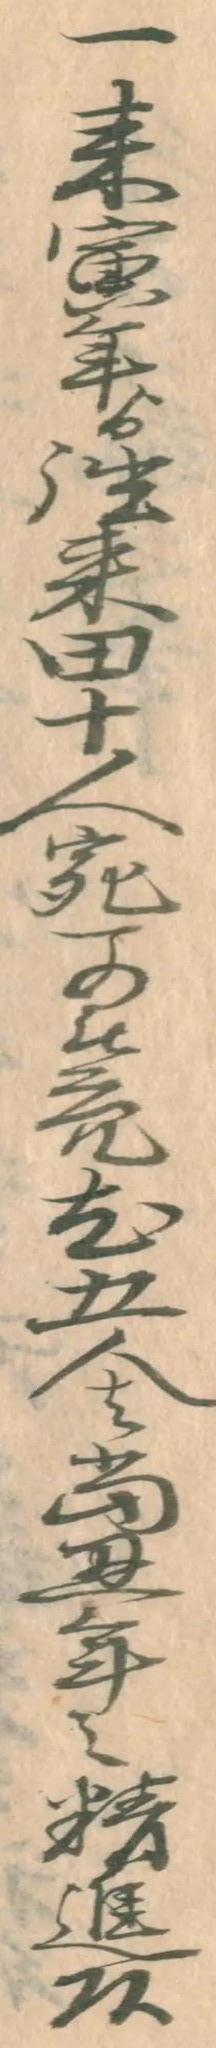一、来寅年ゟ往来田十人宛可被宛尤五人者當丑年之精進頭
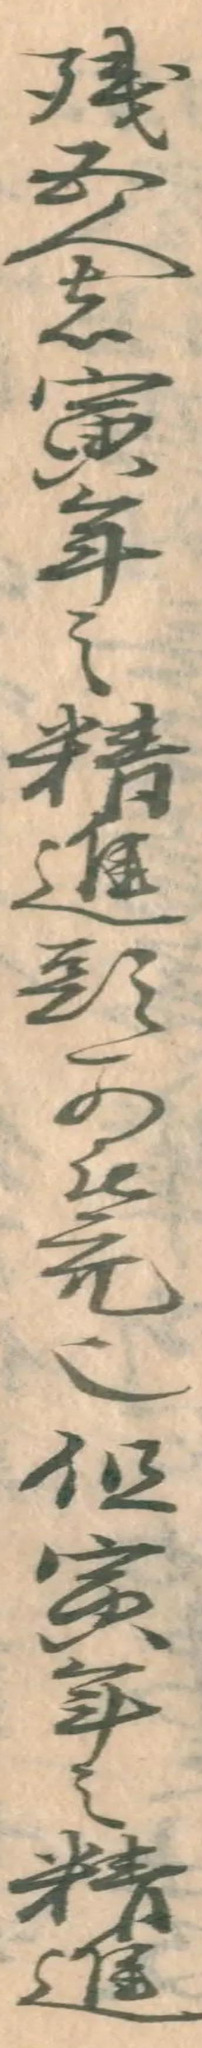残五人者寅年之精進頭可被充也但寅年之精進
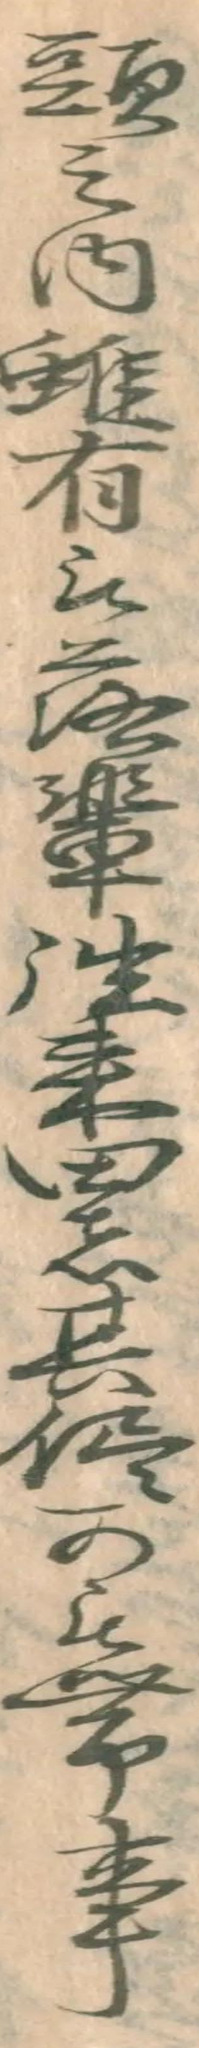頭之内雖有被落輩往来田者其儘可被帯事
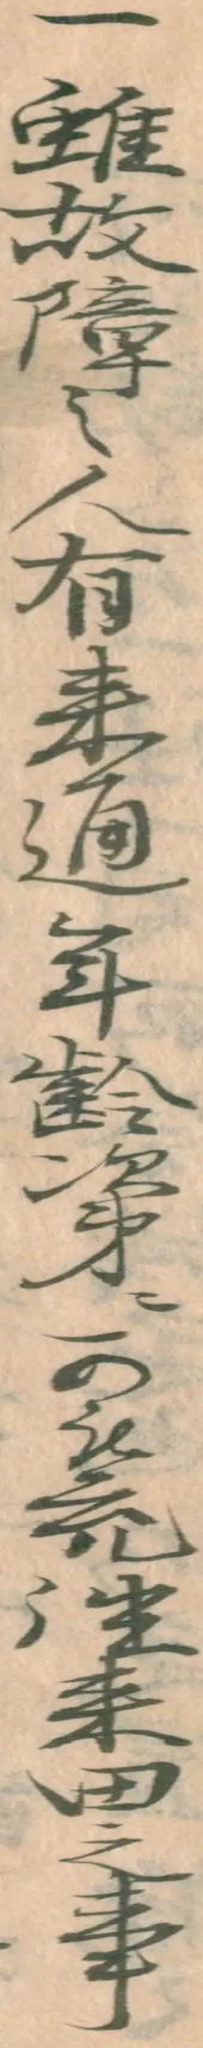一、雖故障之人有来通年齢次第ニ可被充往来田之事
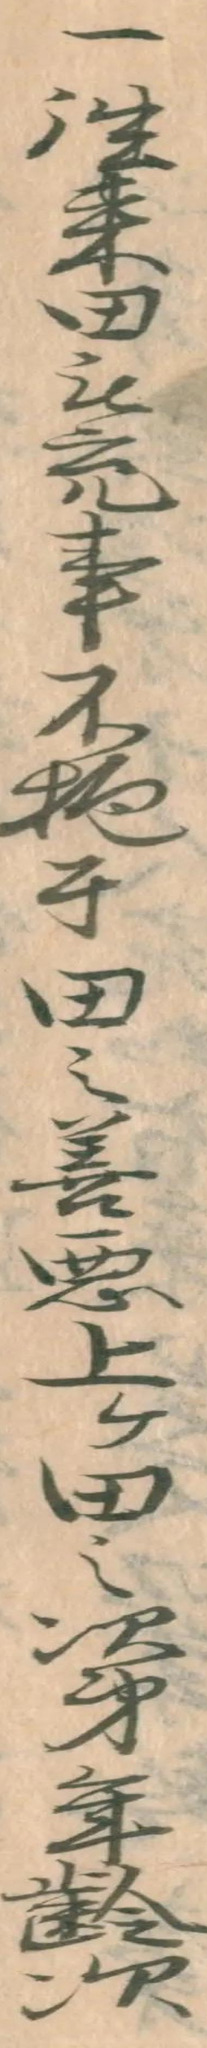一、往来田被充事不拘于田之善悪上ケ田之次第年齢次
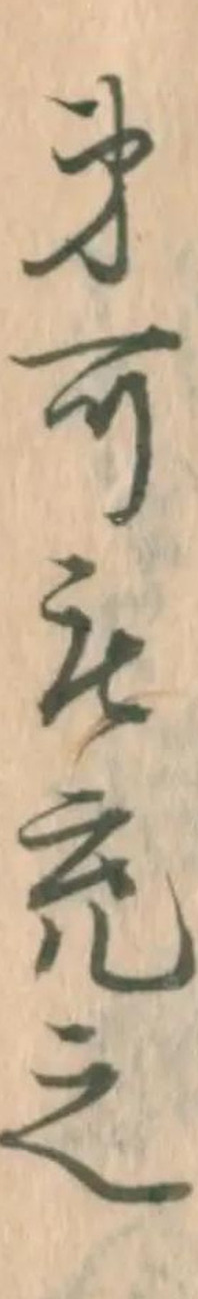第可被充之
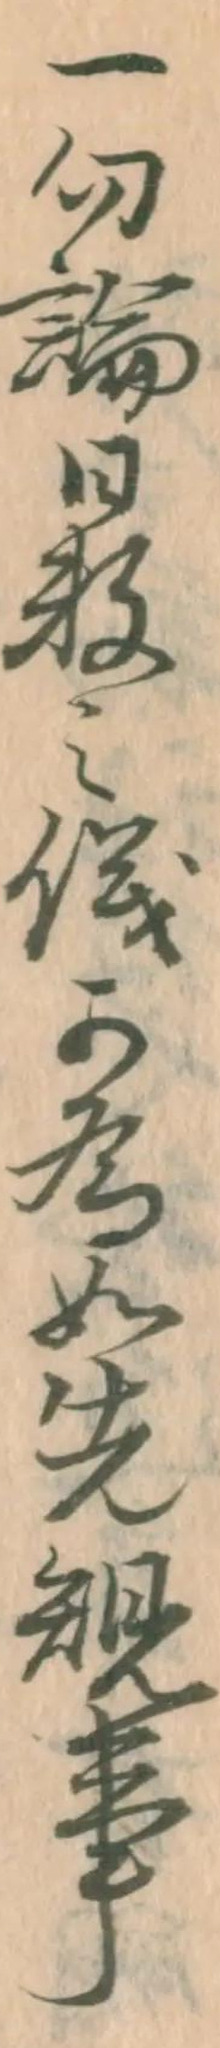一、勿論日数之儀可為如先規事
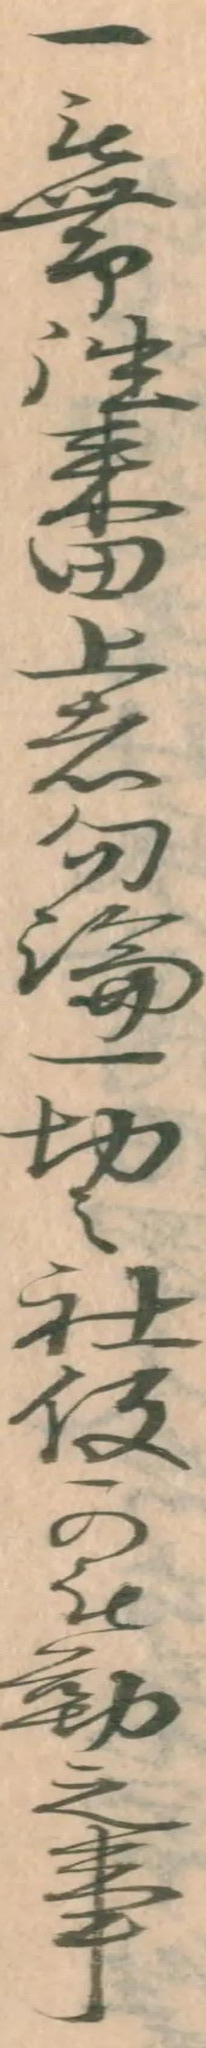一、被帯往来田上者勿論一切之社役可被勤之事
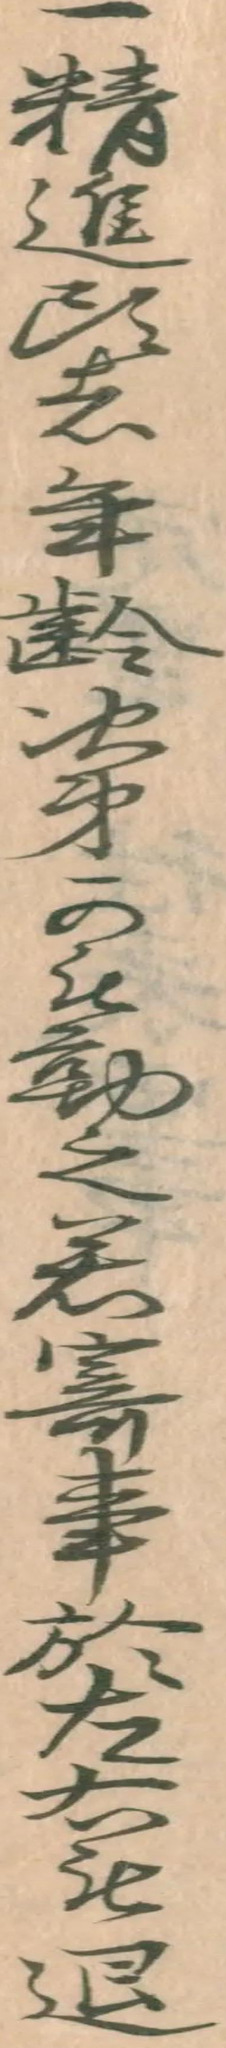一、精進頭者年齢次第可被勤之若寄事於左右被退
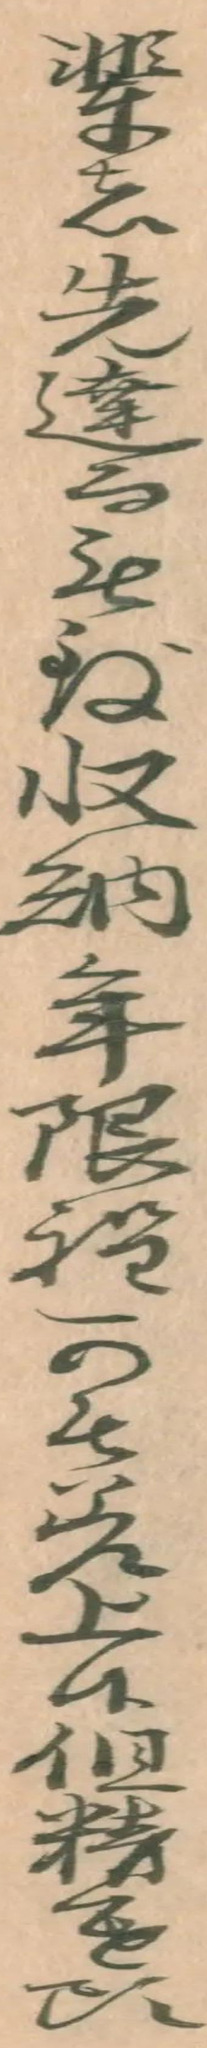輩者先達而被致収納年限程可被差上候但精進頭
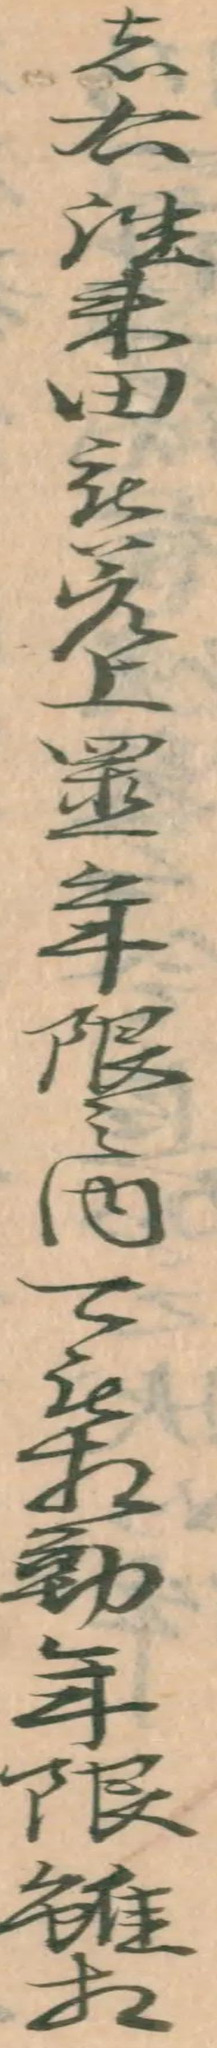者右往来田被差上置年限之内可被相勤年限雖相
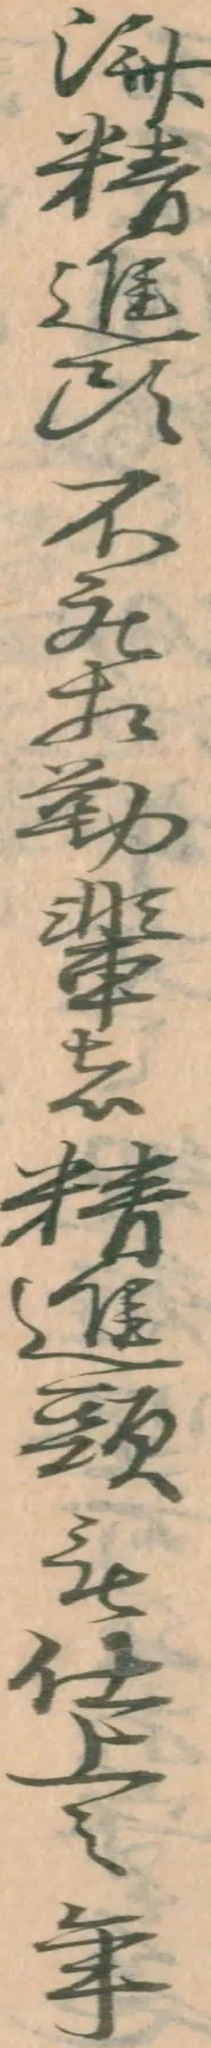済精進頭不充相勤輩者精進頸被仕上之年
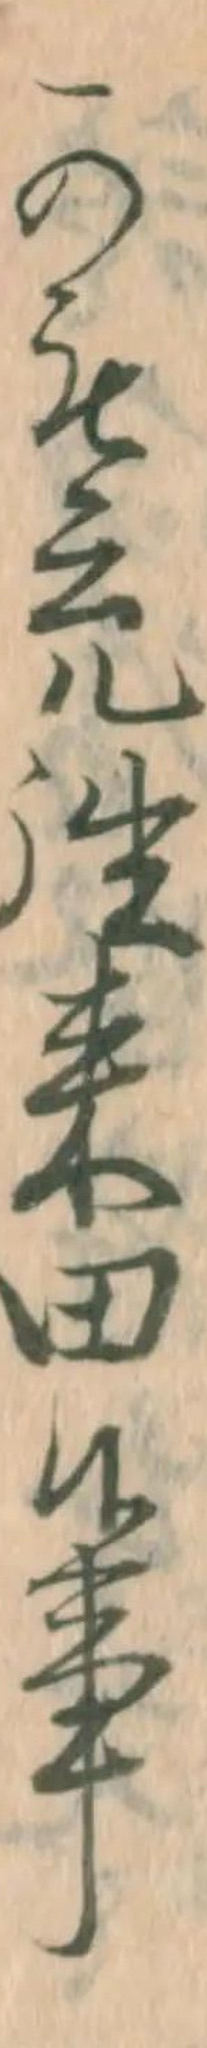可被充ル往来田之事
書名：賀茂社記録. 第39冊
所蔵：国立国会図書館 National Diet Library, JAPAN
